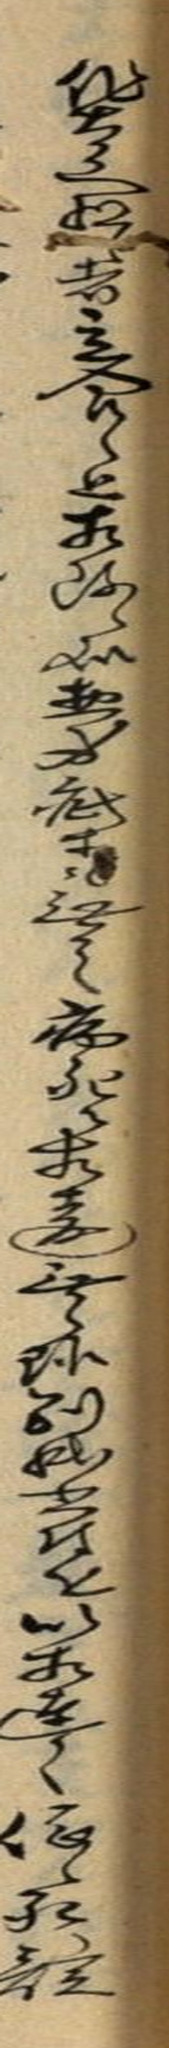作大夫組之者立合之上相改候処惣身疵等も無之病死に相違無之趣別紙書付を以相達之依之死骸
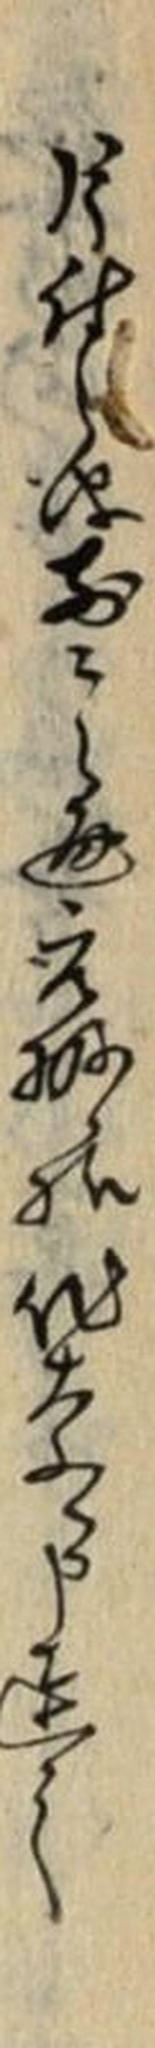片付之儀前々之通取扱候様作大夫へ申達之
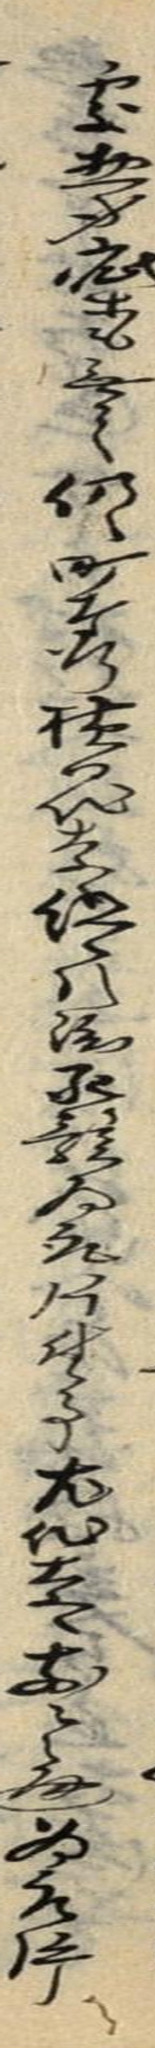処惣身疵等も無之仍之町奉行横田作大夫組へ引渡死骸為取片付候事尤作大夫へ前々之通為取片
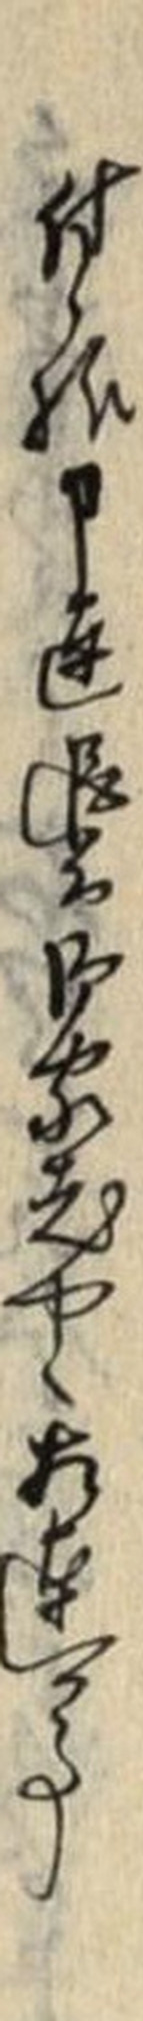付候様申達追て御家老中へ相達候事
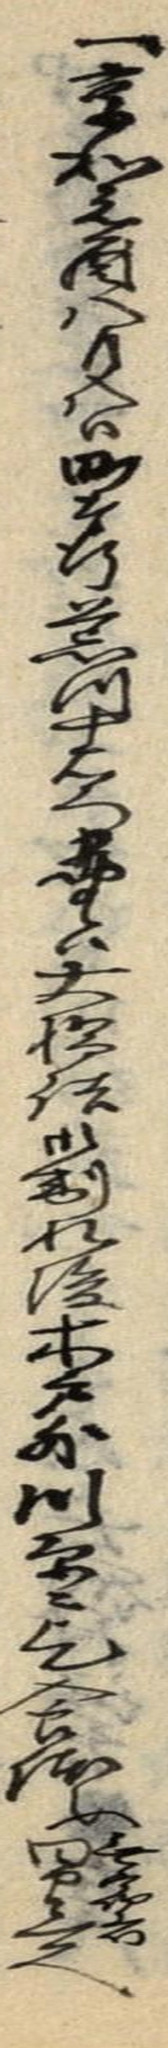一享和元酉八月八日町奉行荒川十右衛門申聞候は大橋詰御制札後木戸外川原に乞食体之男壱人
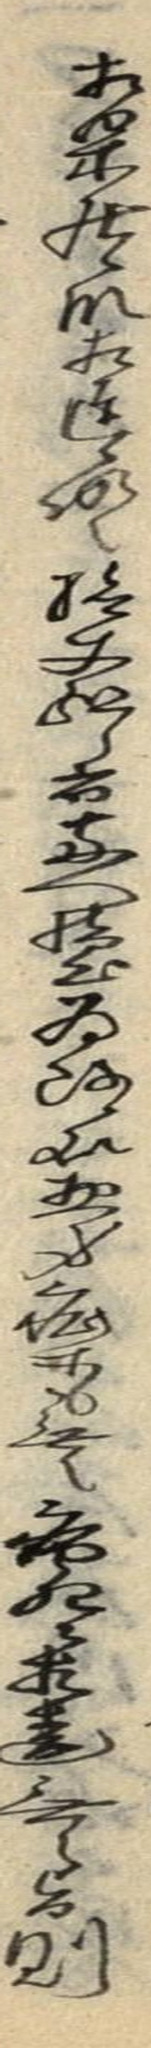相果居候段相達候仍之検使組之者両人指出為改候処惣身疵等も無之病死に相違無之旨則
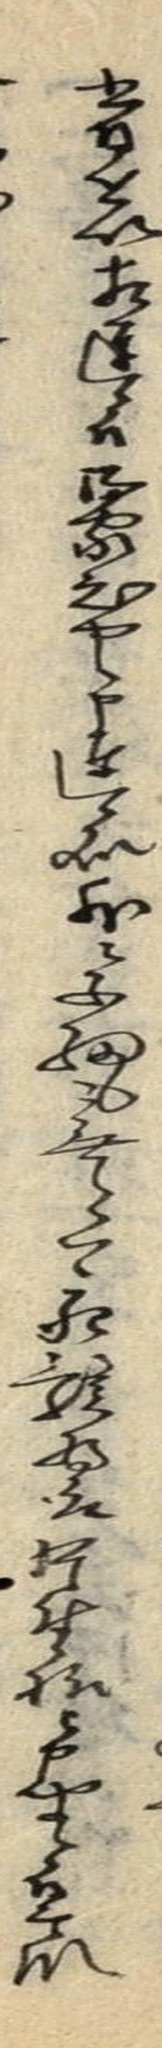書付を以相達候に付御家老中へ申達候処外に子細も無之候はゝ死骸為取片付候様被申聞候に付其段
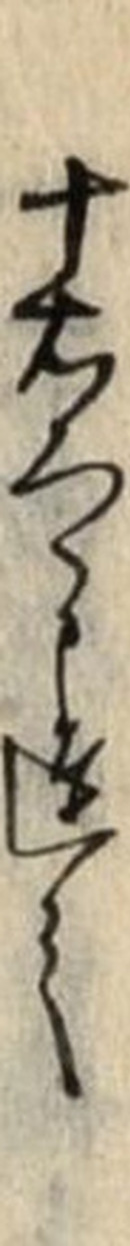十右衛門へ申達之
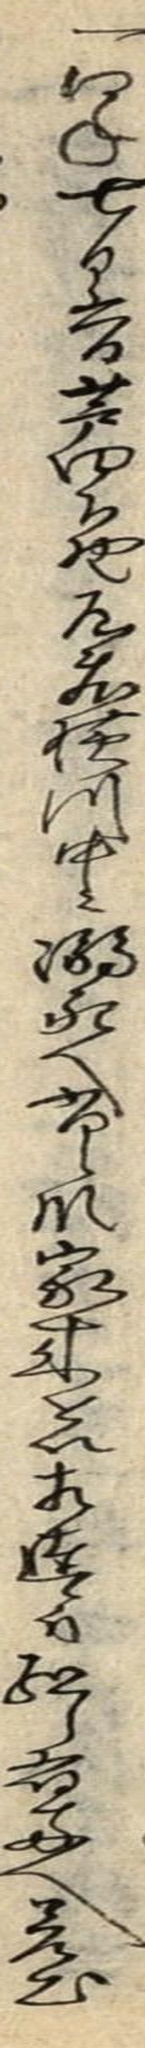一同年七月六日芦田下野屋敷横川中に溺死人有之段家来を以相達候に付組之者両人差出
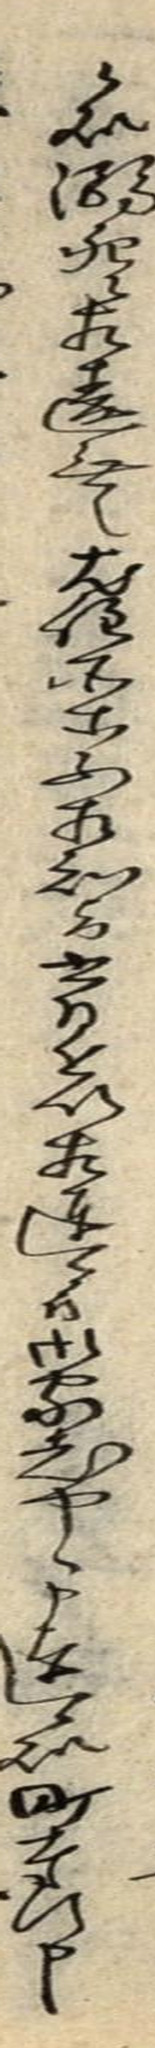候処溺死に相違無之尤住所等不相知旨書付を以相達候に付御家老中へ申達候処町奉行申
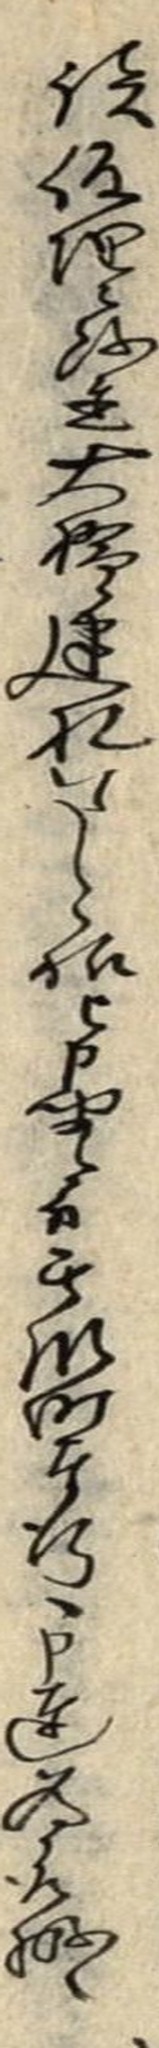談仮埋に致置大橋へ建札いたし候様被申聞候に付其段町奉行へ申達為取扱候
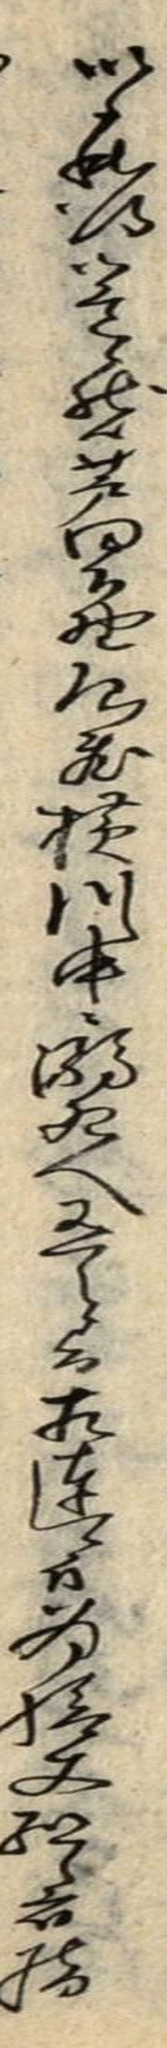以手紙得御意候然は芦田下野屋敷横川中に溺死人有之候旨相達候に付為検使組之者指
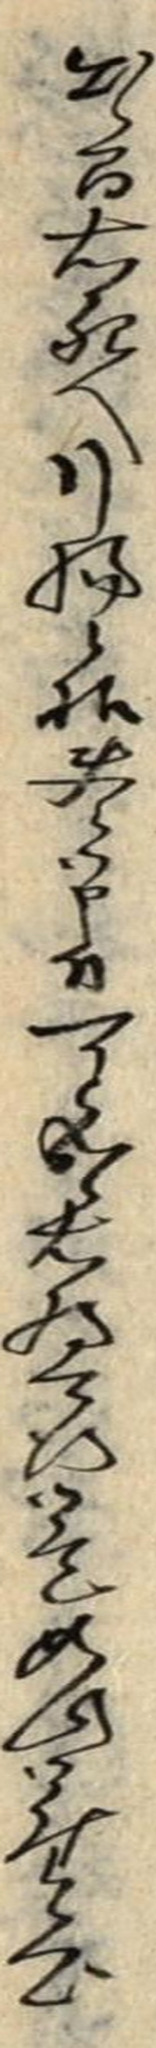出候間右死人引揚候様夫々御申付可被成候右為可得御意如此御座候以上
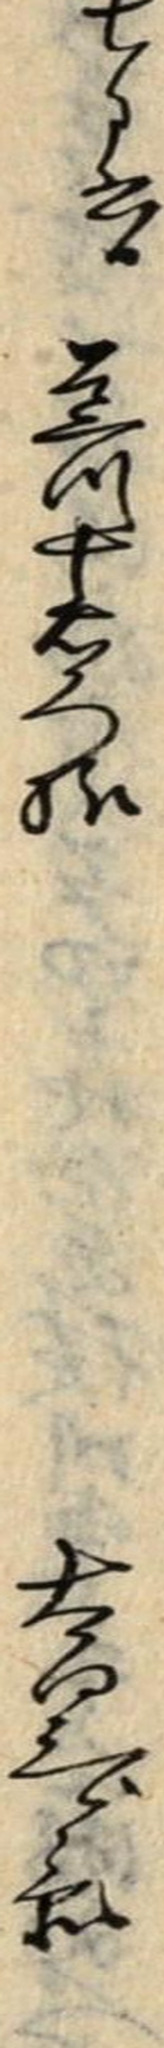七月六日荒川十右衛門様太田三郎兵衛

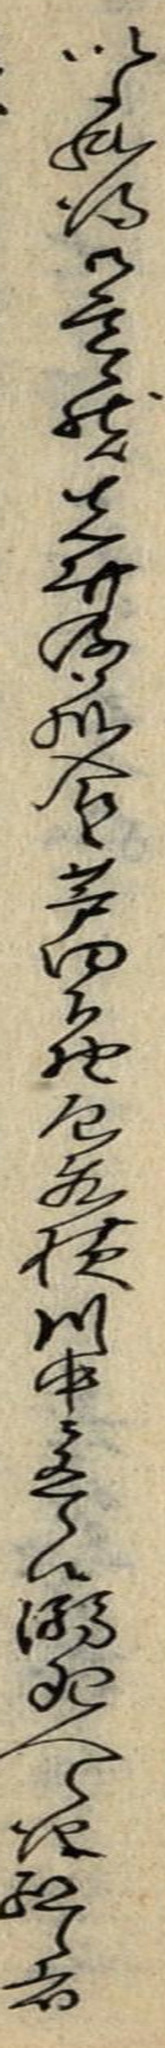以手紙得御意候然は先刻及御掛合候芦田下野屋敷横川中に有之候溺死人之儀組之者
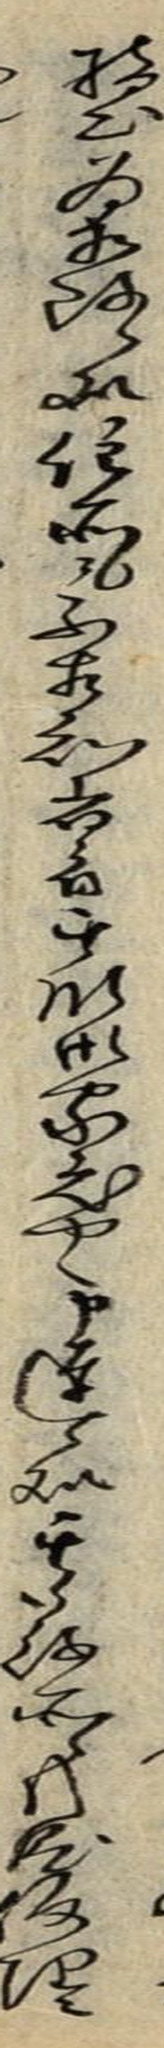指出為相改候処住所も不相知者に付其段御家老中へ申達候処其御役所へ引渡仮埋に
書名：御停止異変死失
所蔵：福井県文書館 Fukui Prefectural Archives
